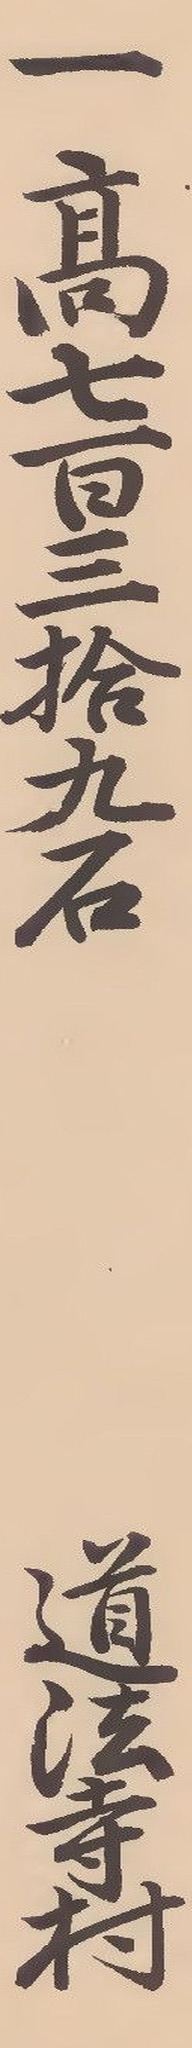一高七百三拾九石道法寺村
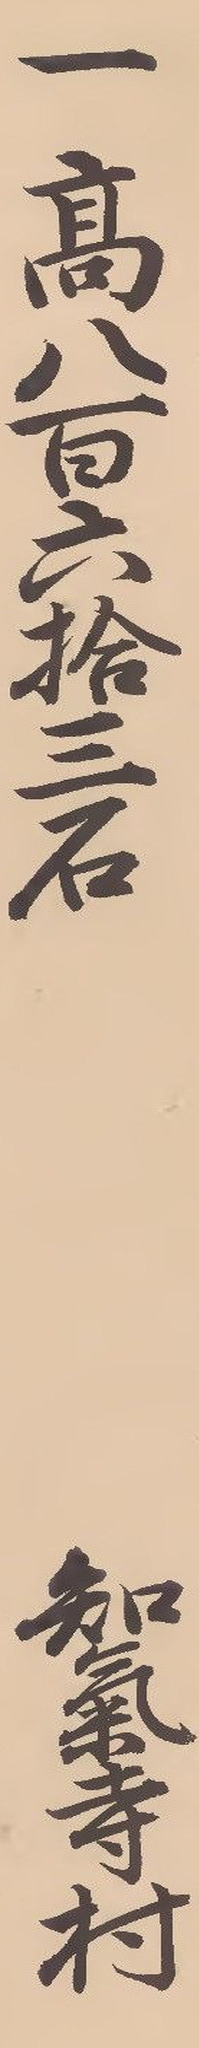一高八百六拾三石知気寺村
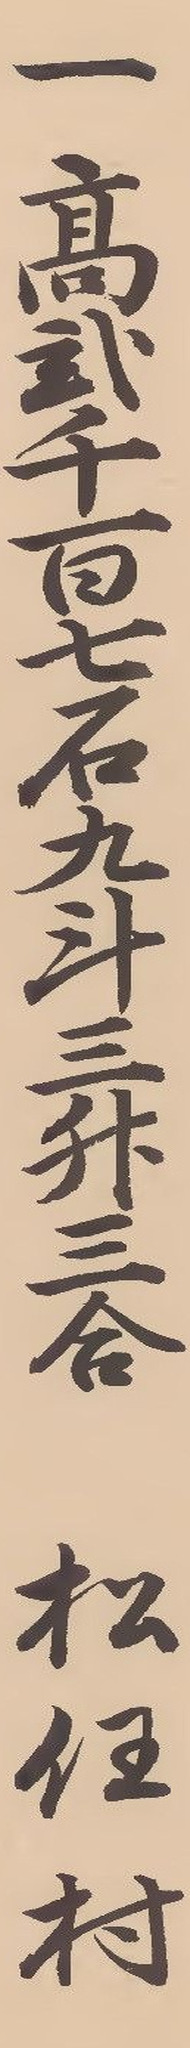一高弐千百七石九斗三升三合松任村
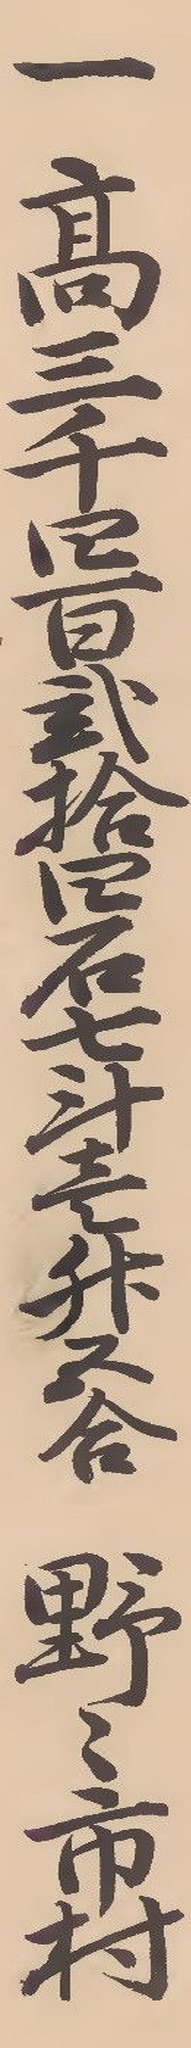一高三千四百弐拾四石七斗壱升五合野々市村
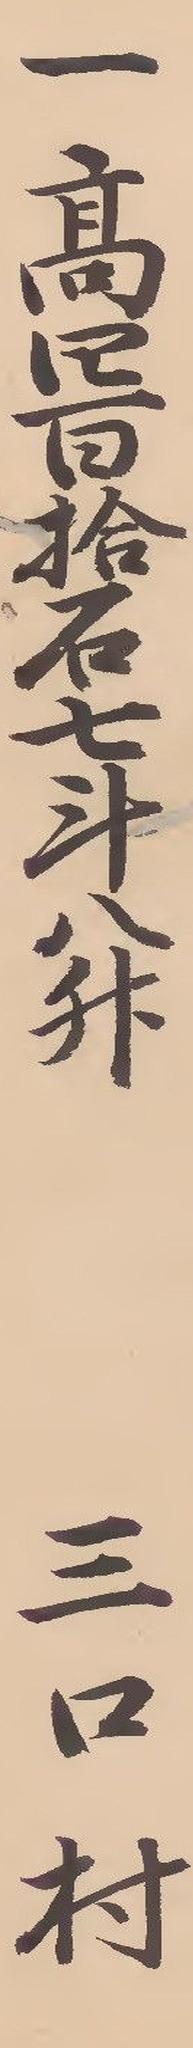一高四百拾石七斗八升三口村

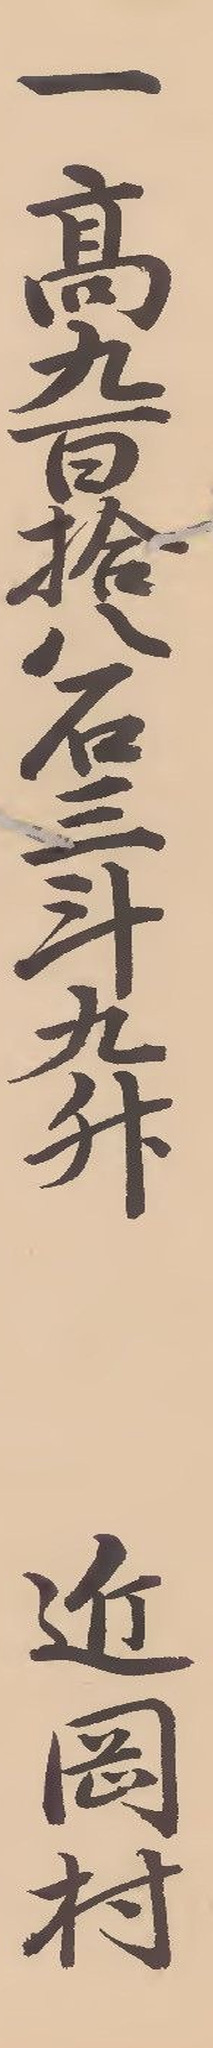一高九百拾八石三斗九升近岡村
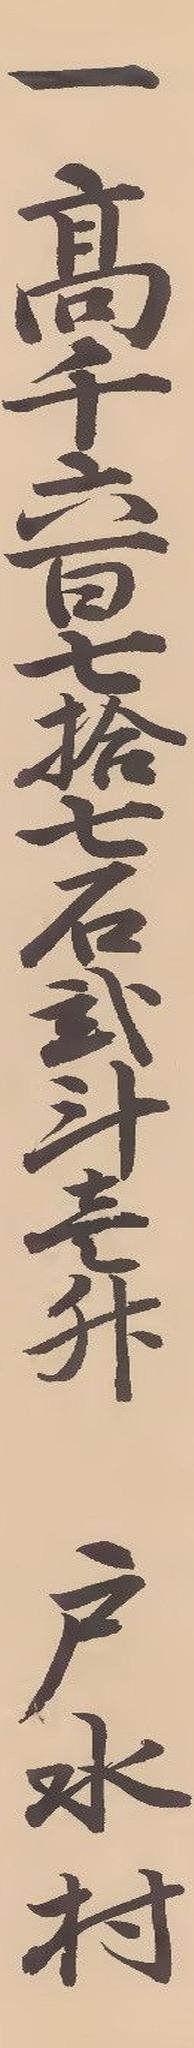一高千六百七拾七石弐斗壱升戸水村
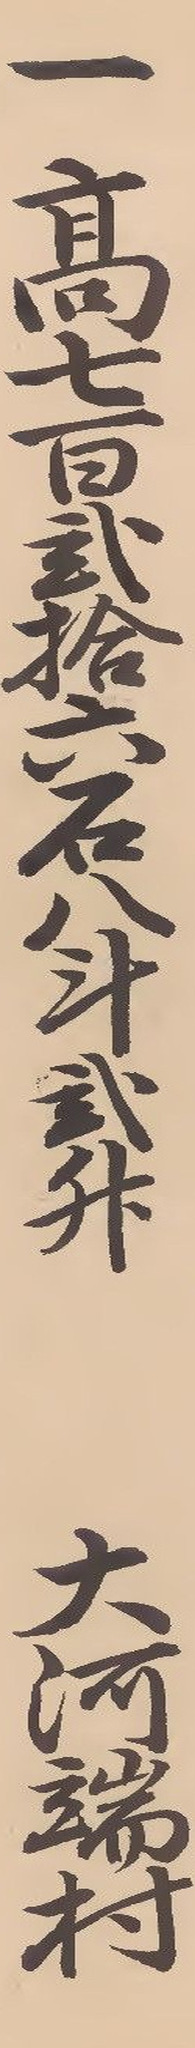一高七百弐拾六石八斗弐升大河端村
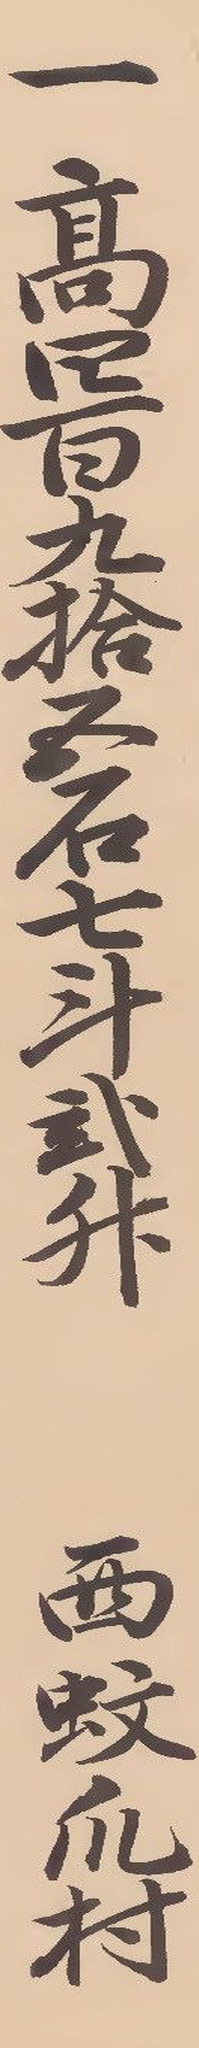一高四百九拾五石七斗弐升西蚊爪村
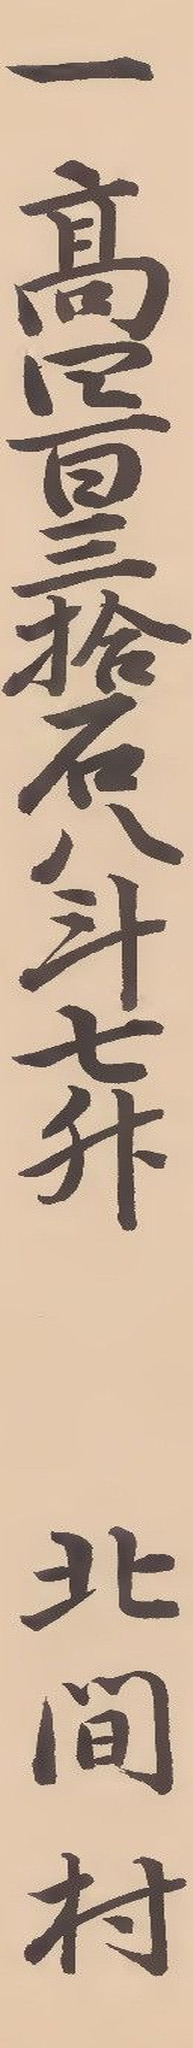一高四百三拾石八斗七升北間村
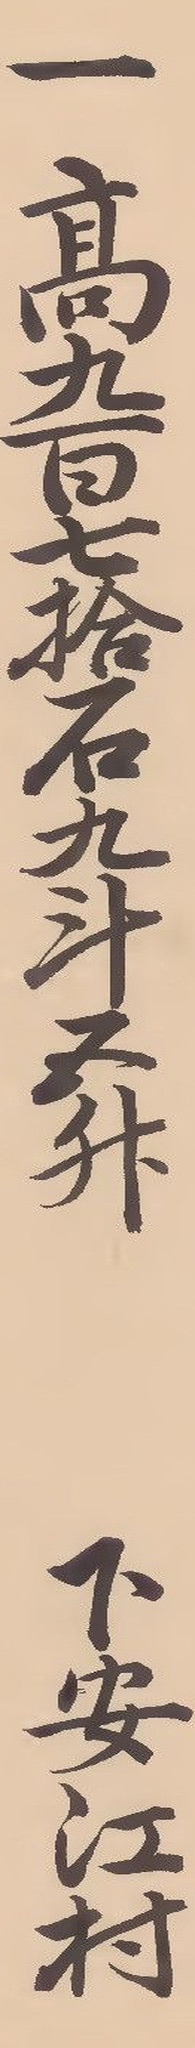一高九百七拾石九斗五升下安江村
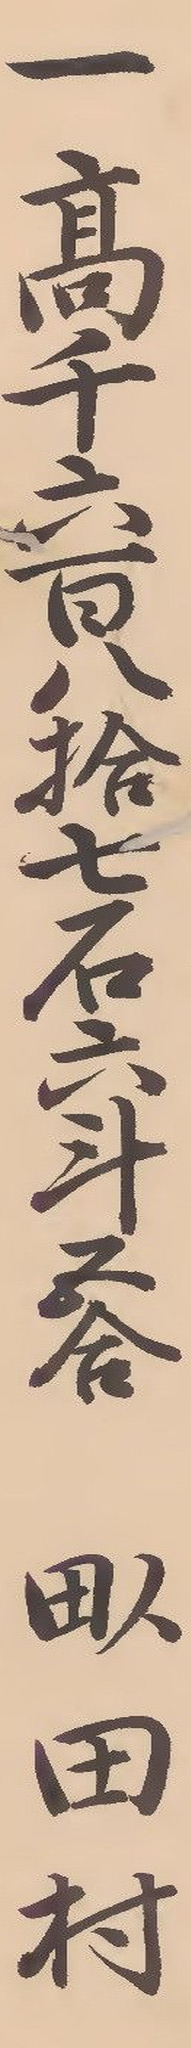一高千六百八拾七石六斗五合畝田村

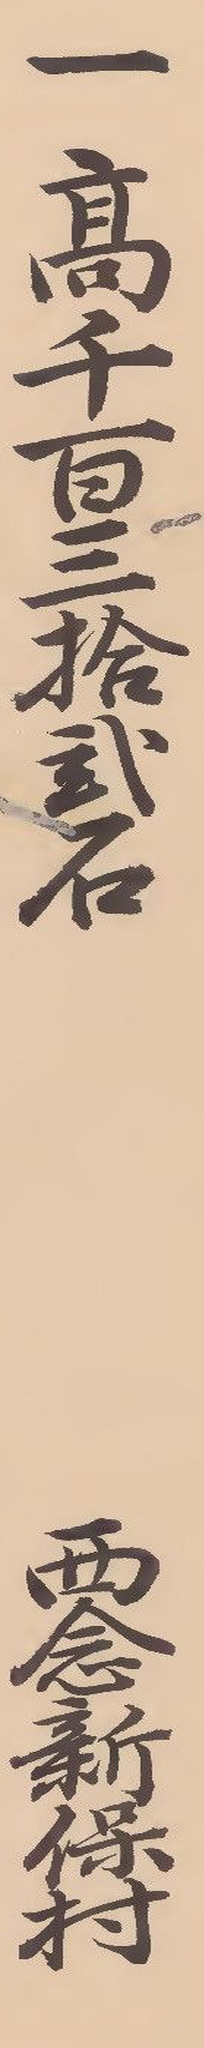一高千百三拾弐石西念新保村
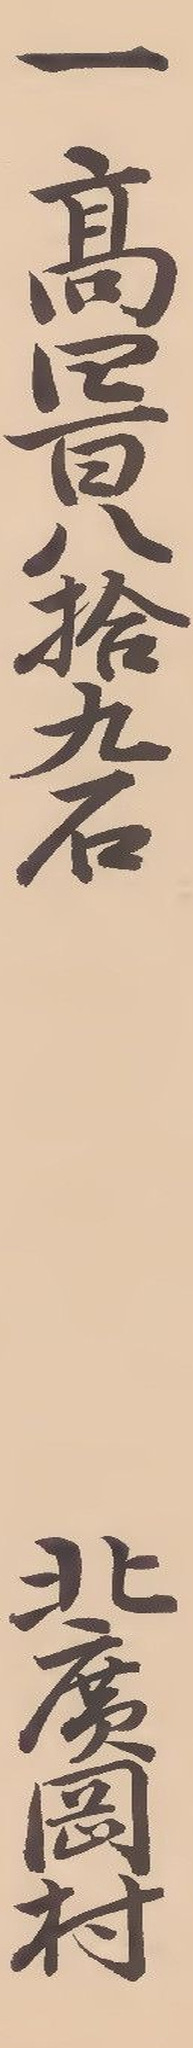一高四百八拾九石北広岡村
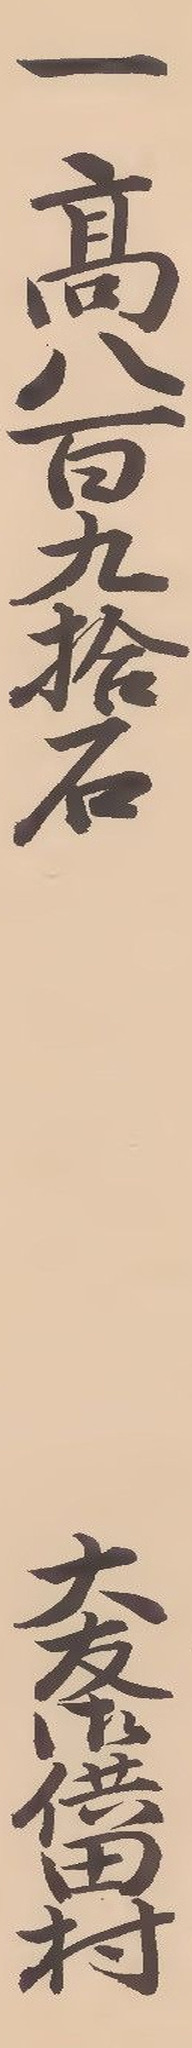一高八百九拾石大友御供田村
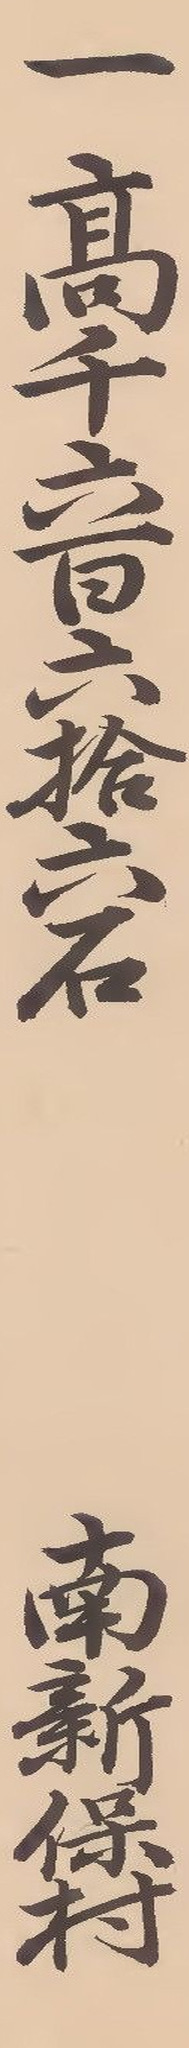一高千六百六拾六石南新保村
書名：加賀国郷帳
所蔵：国立公文書館 National Archives of Japan
